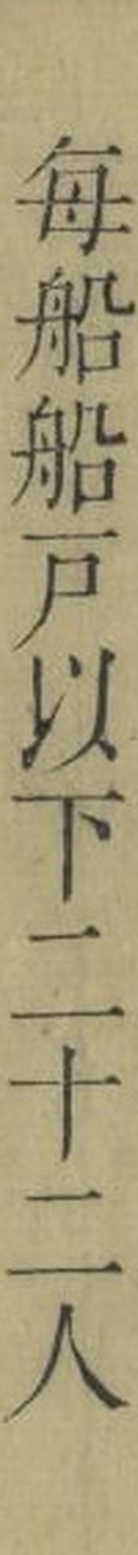每船船戸以下二十二人
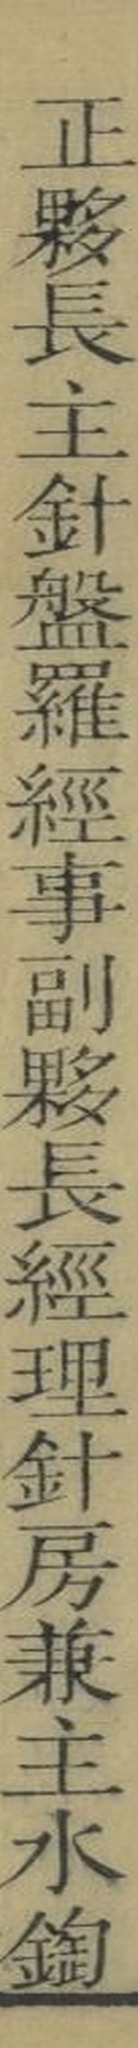正夥長主針盤羅經事副夥長經理針房兼主水鋾
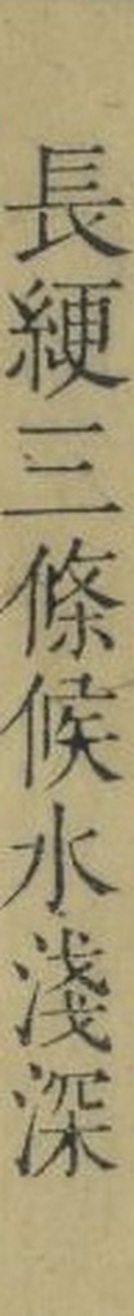長綆三條候水淺深
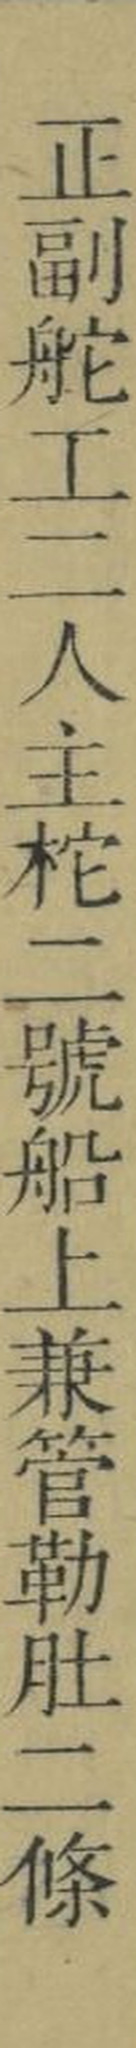正副舵工二人主柁二號船上兼管勒肚二條
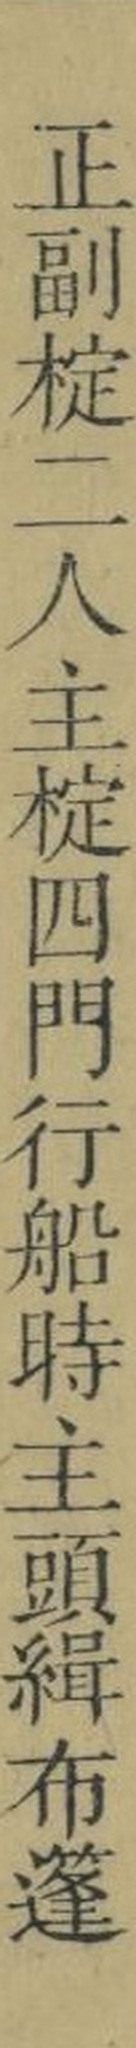正副椗二人主椗四門行船時主頭緝布篷
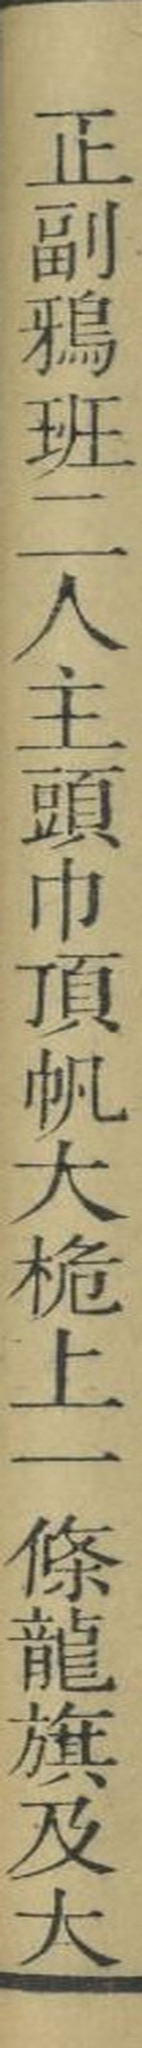正副鴉班二人主頭巾頂帆大桅上一條龍旗及大
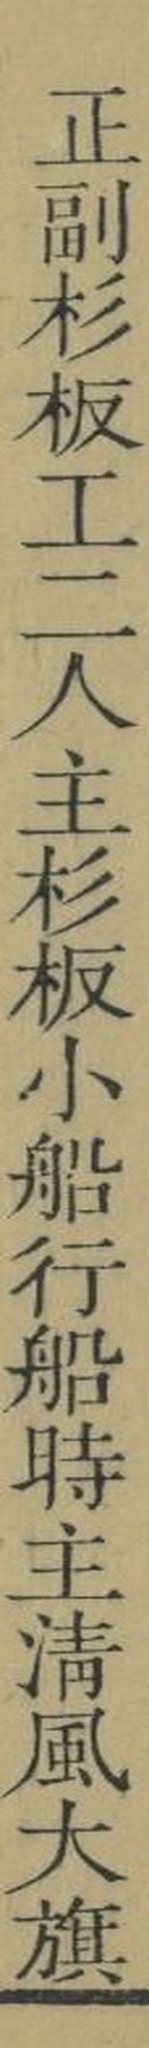正副杉板工二人主杉板小船行船時主淸風大旗
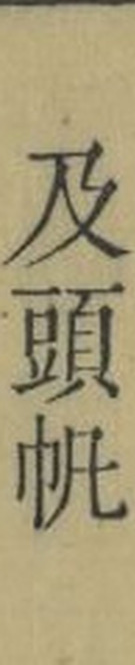及頭帆
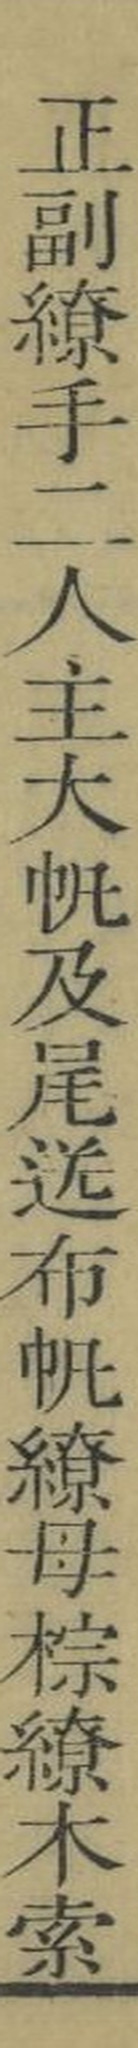正副繚手二人主大帆及尾送布帆繚母棕繚木索
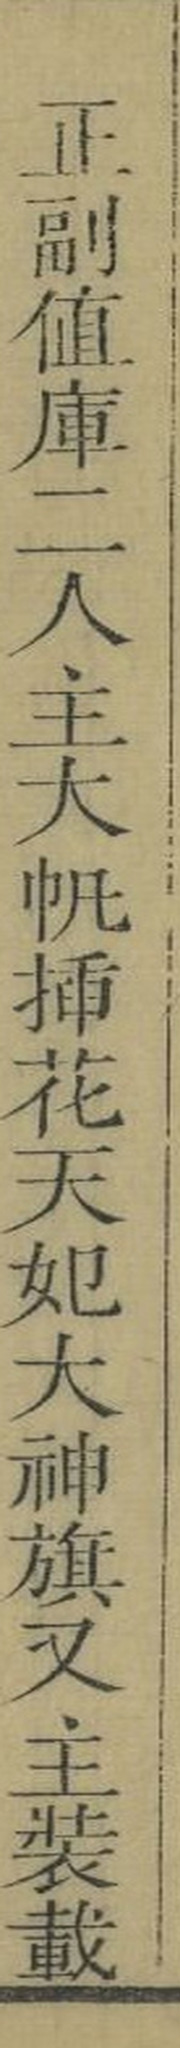正副値庫二人主大帆揷花天妃大神旗又主裝載
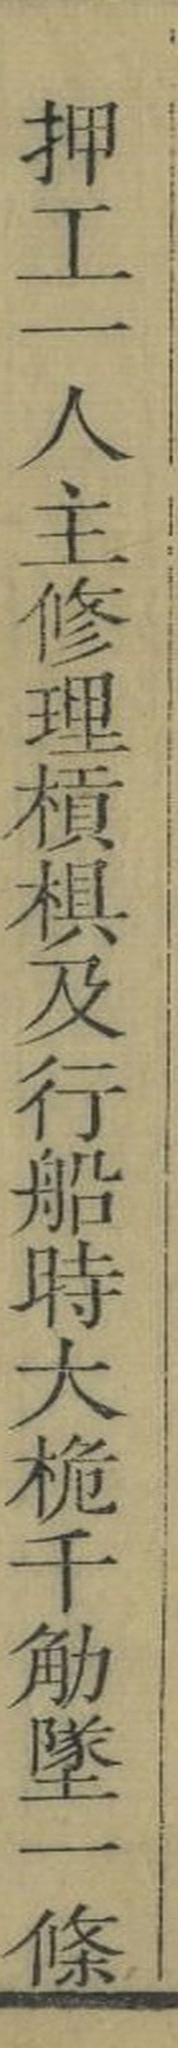押工一人主修理槓椇及行船時大桅千觔墜一條
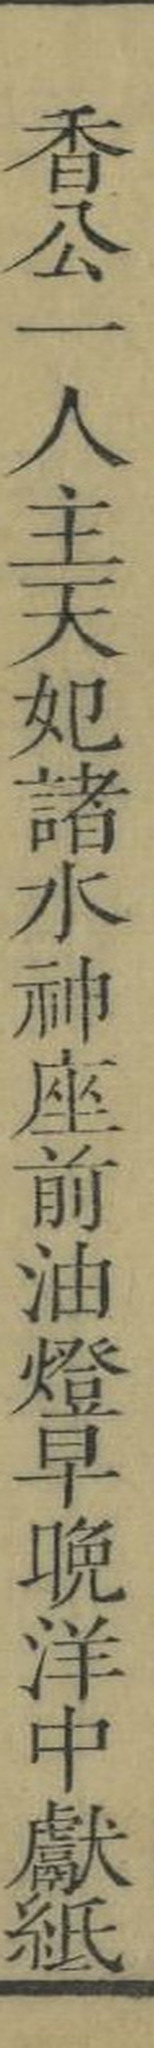香公一人主天妃諸水神座前油燈早晩洋中獻紙
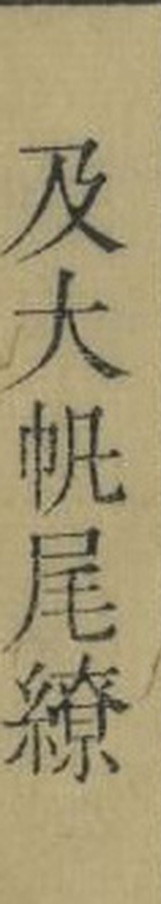及大帆尾繚

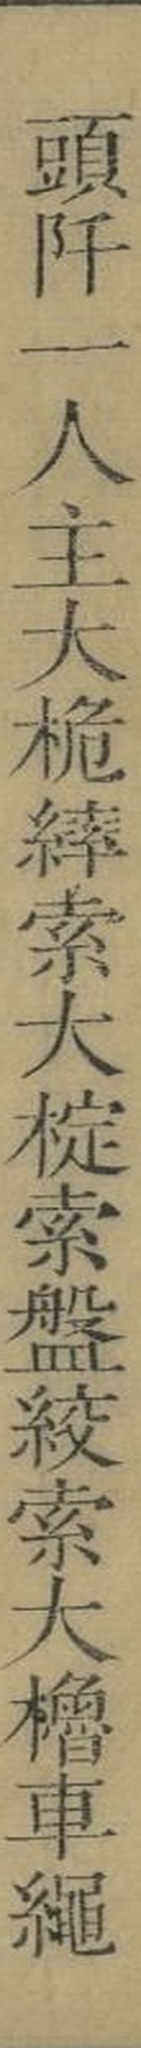頭阡一人主大桅繂索大椗索盤絞索大櫓車繩
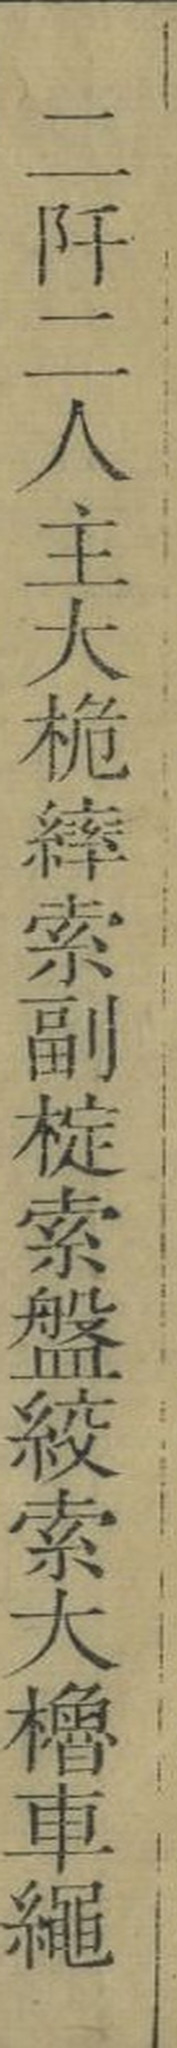二阡二人主大桅繂索副椗索盤絞索大櫓車繩
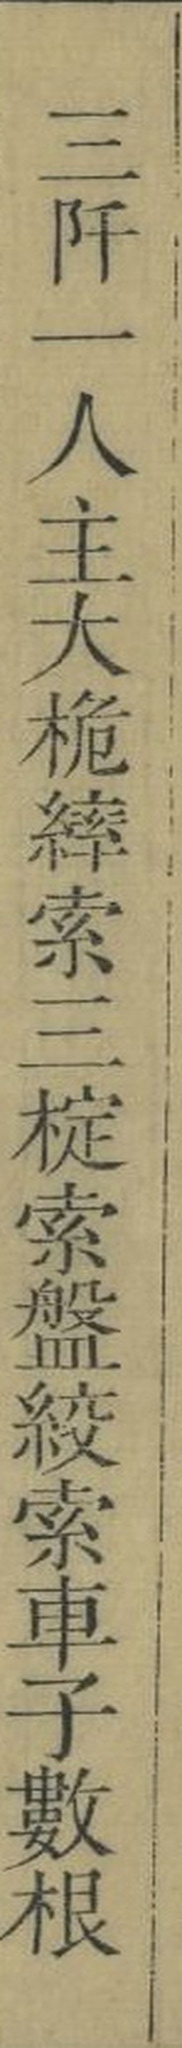三阡一人主大桅繂索三椗索盤絞索車子數根
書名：中山伝信録 巻一
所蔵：University of the Ryukyus Library
